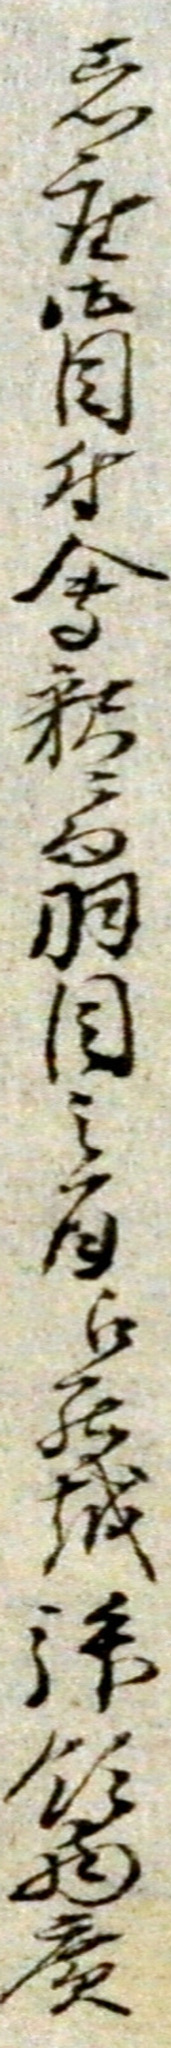着座御目付会釈ニ而羽目之間江罷越拝領物廣
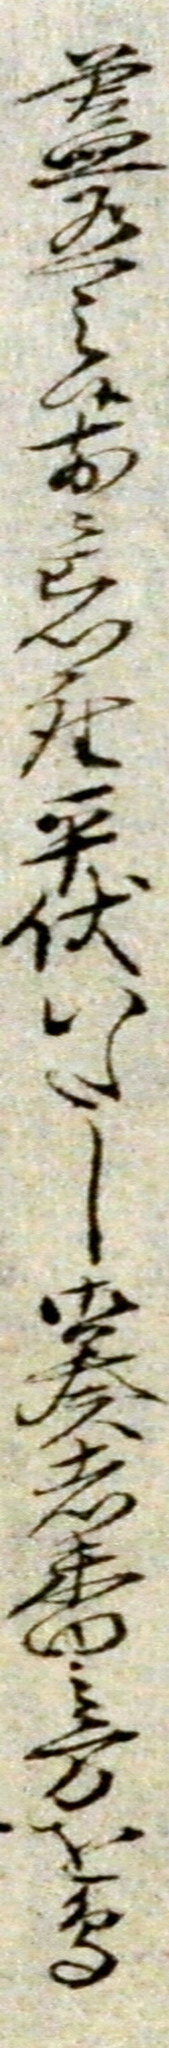蓋有之前着座平伏いたし御奏者番之方を鳥
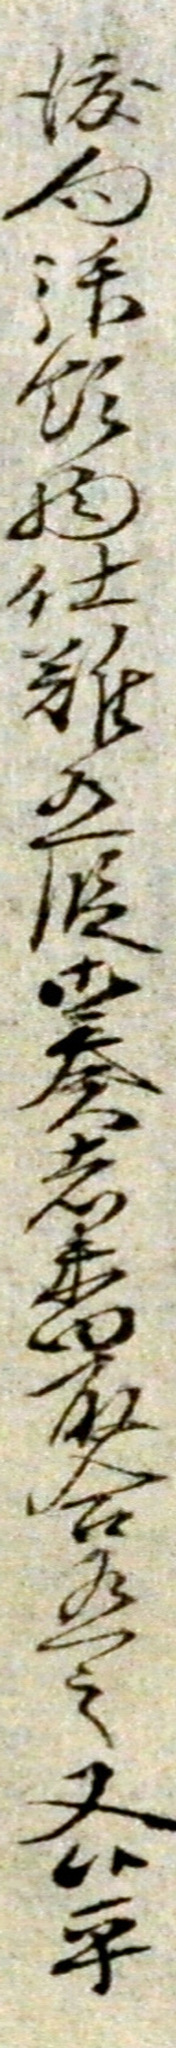渡向拝領物仕難有段御奏者番取合有之又候平
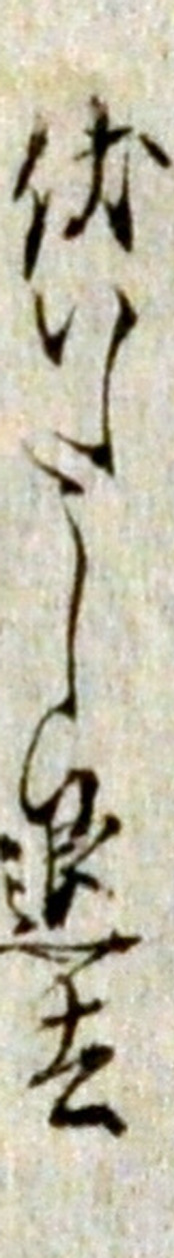伏いたし退去
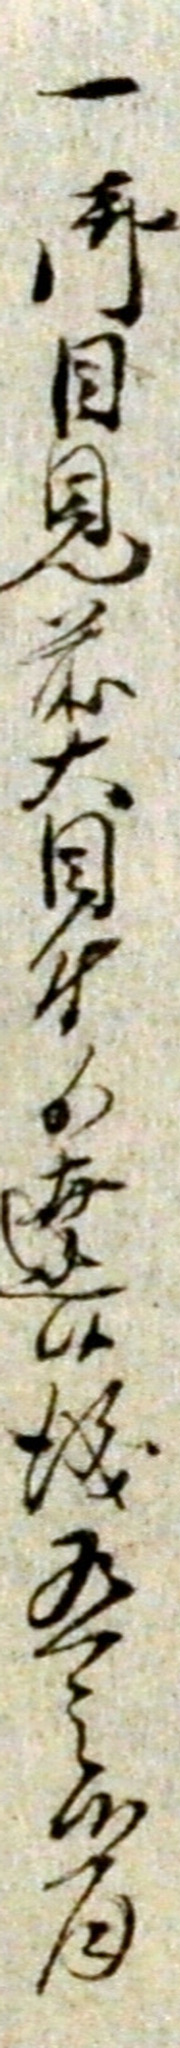一御目見前大目付ゟ達候儀有之候間
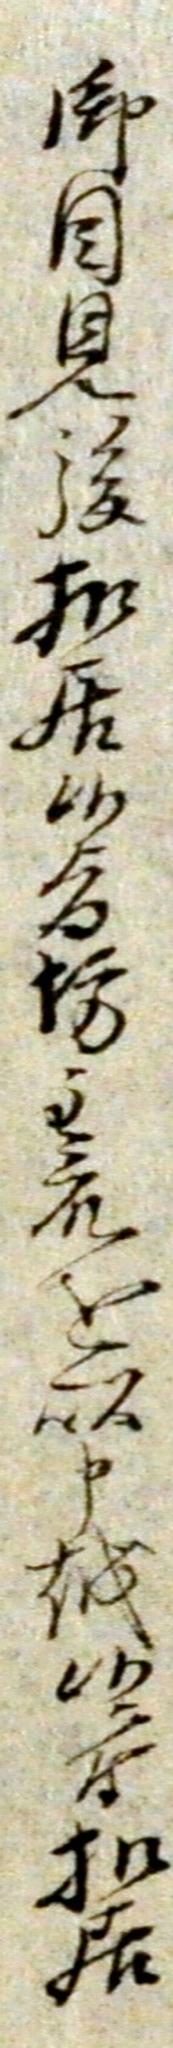御目見後扣居候旨坊主衆を以申越候ニ付扣居
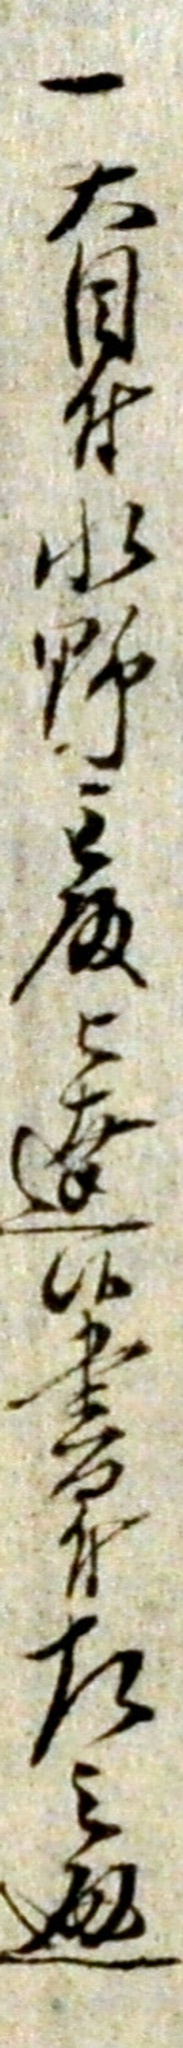一大目付水野主殿ヒ達候書付左之通
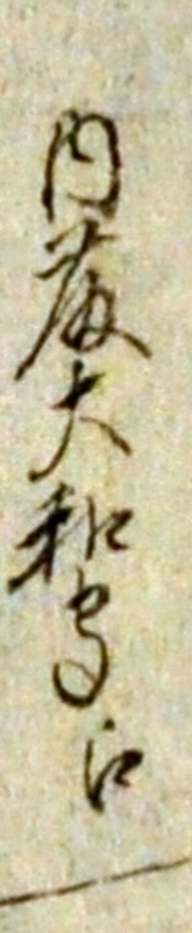内藤大和守江
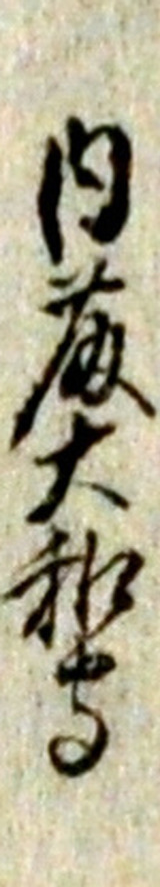内藤大和守
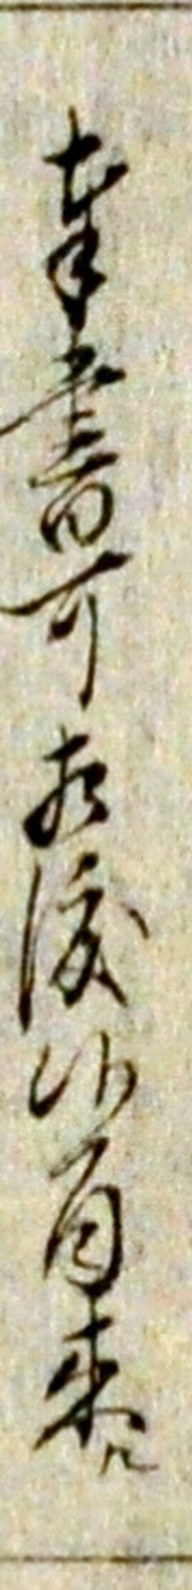奉書可相渡候間来ㇽ
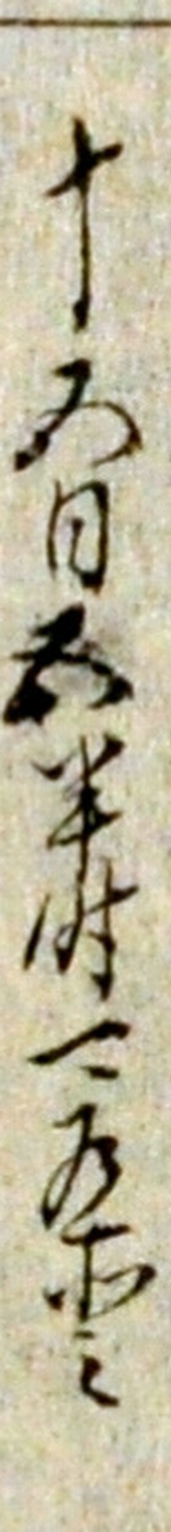十五日五半時可有登
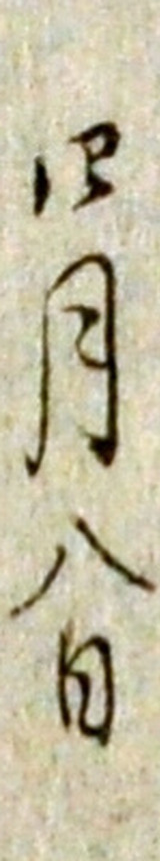四月八日
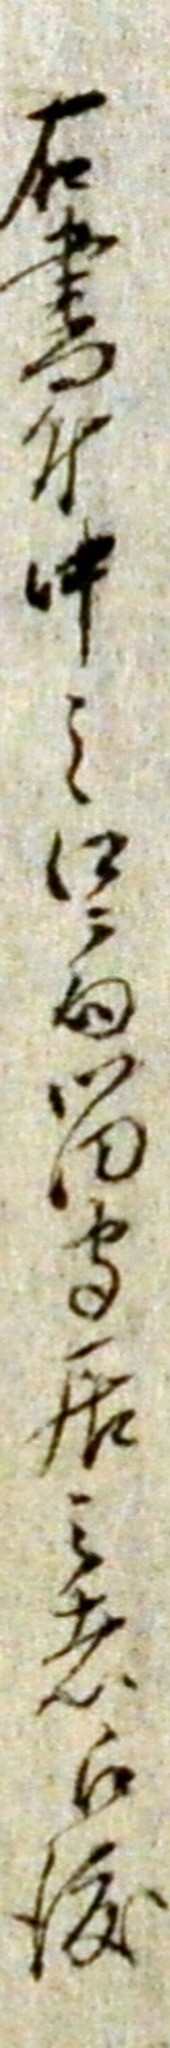右書付申之口二而留守居之者江渡
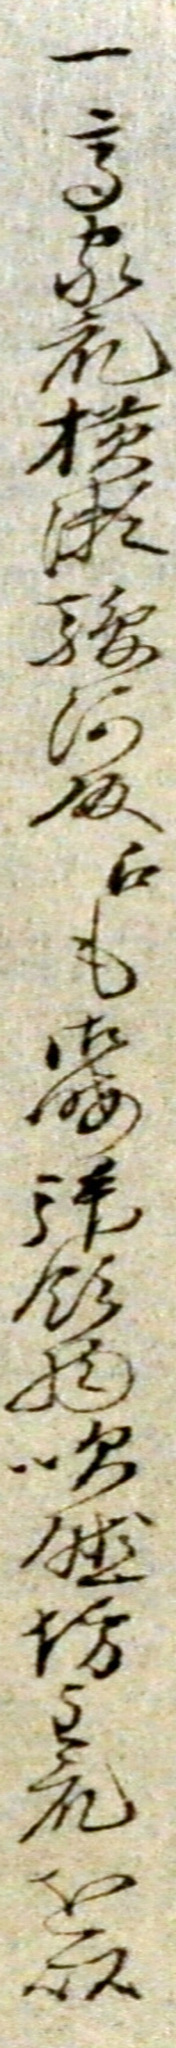一高家衆横瀬駿河殿江も御暇拝領物吹聴坊主衆を以
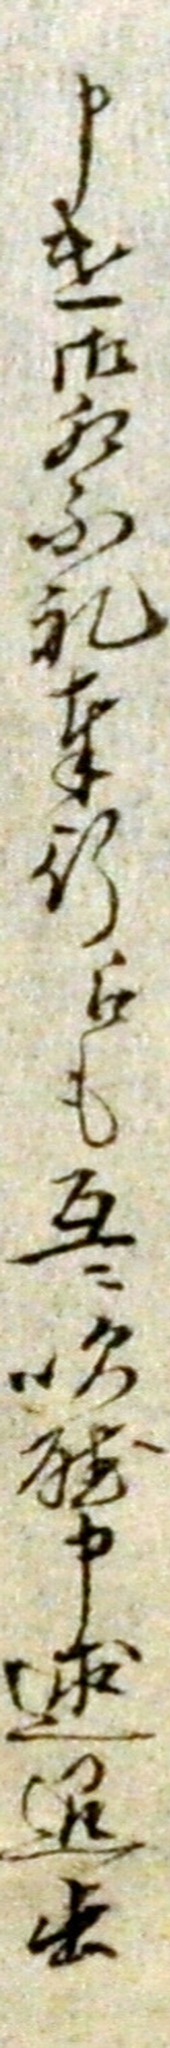申遣御祭礼奉行江も互二吹聴申述退出
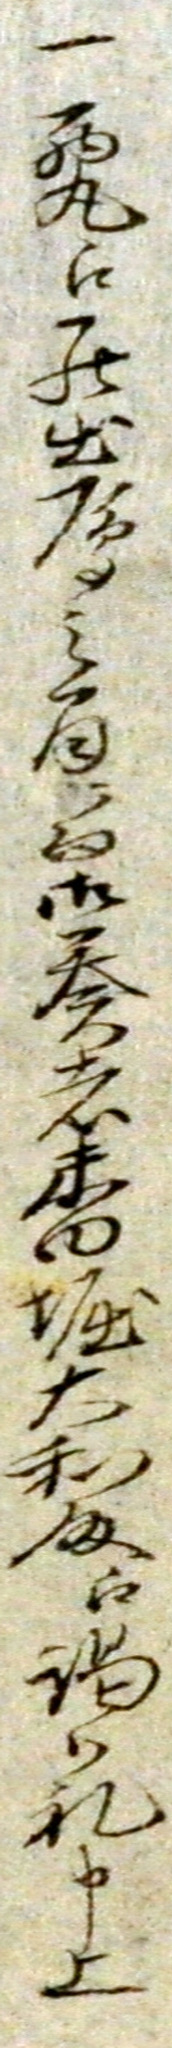一西丸江罷出鷹之間二而御奏者番堀大和殿江謁御礼申上
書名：日光御名代相勤候節ノ留
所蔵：伊那市立高遠町図書館・合同会社AMANE
